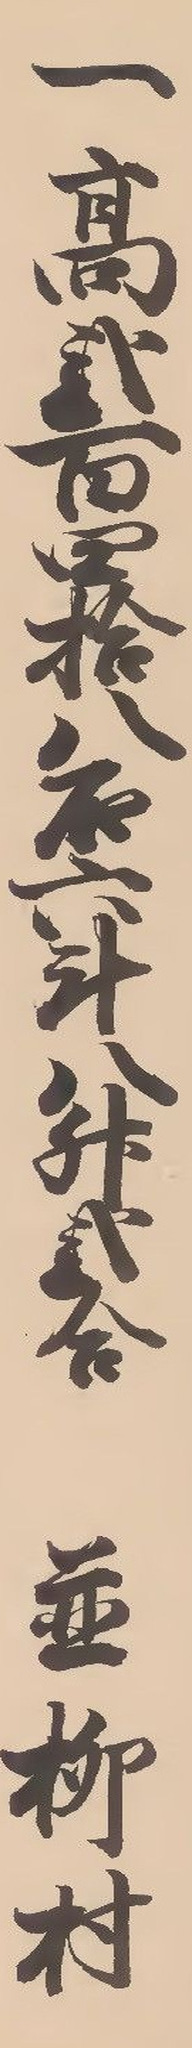一高弐百四拾八石六斗八升弐合並柳村
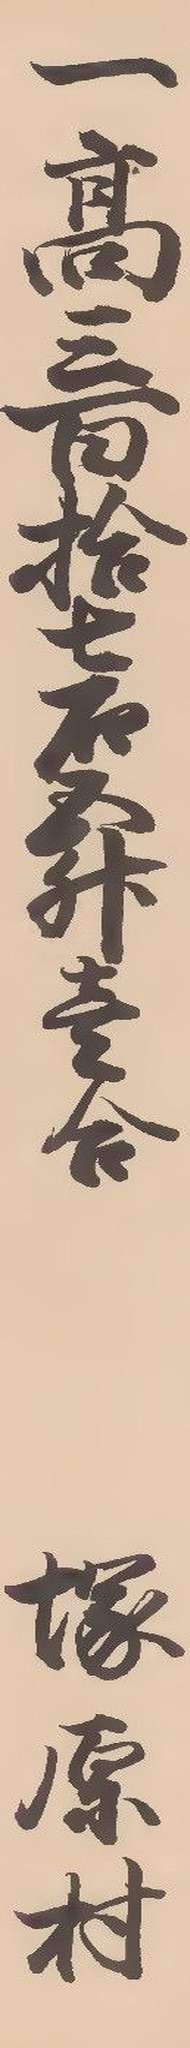一高三百拾七石五升壱合塚原村
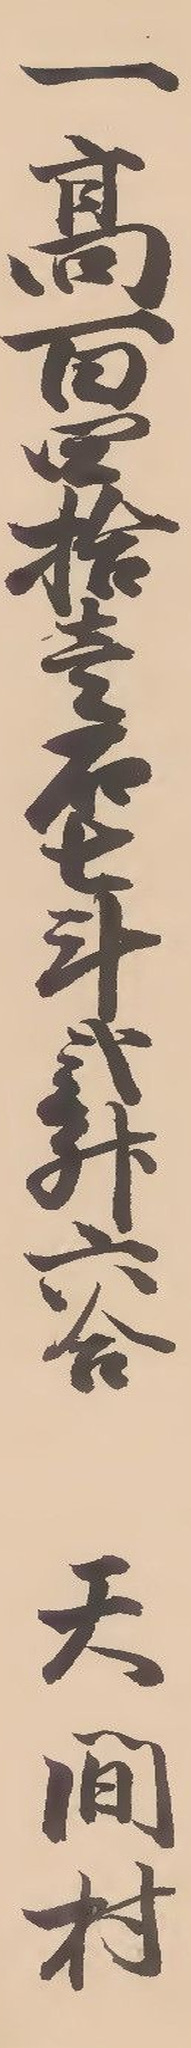一高百四拾壱石七斗弐升六合天間村

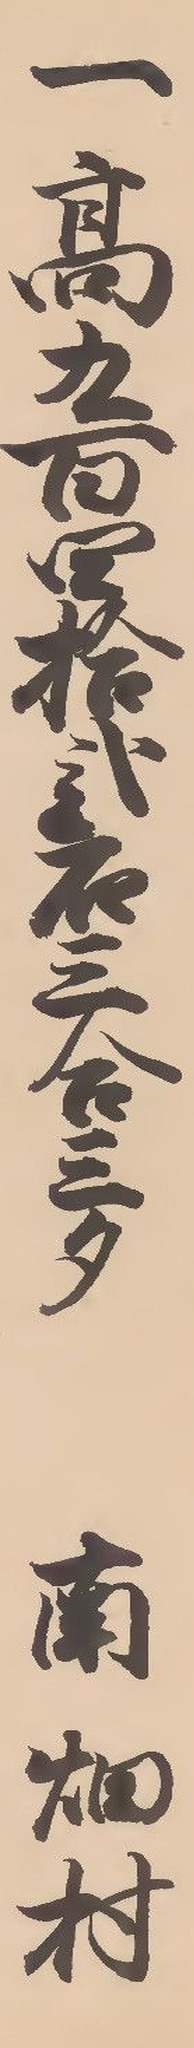一高九百四拾弐石三合三勺南畑村
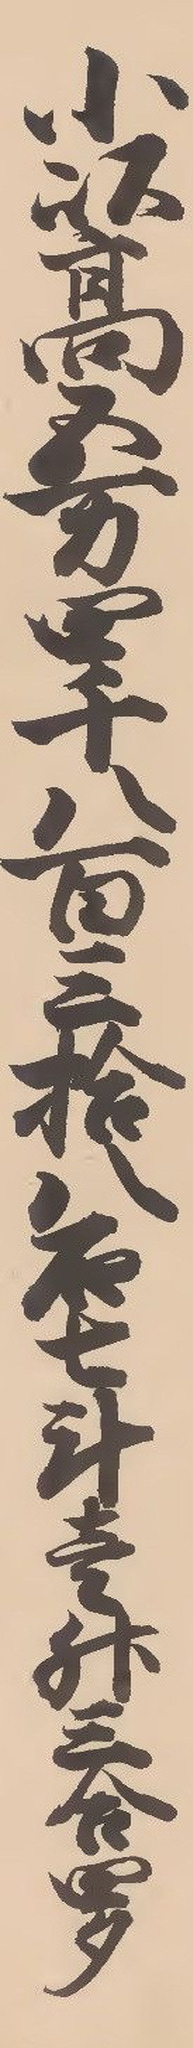小以高五万四千八百三拾八石七斗壱升三合四勺
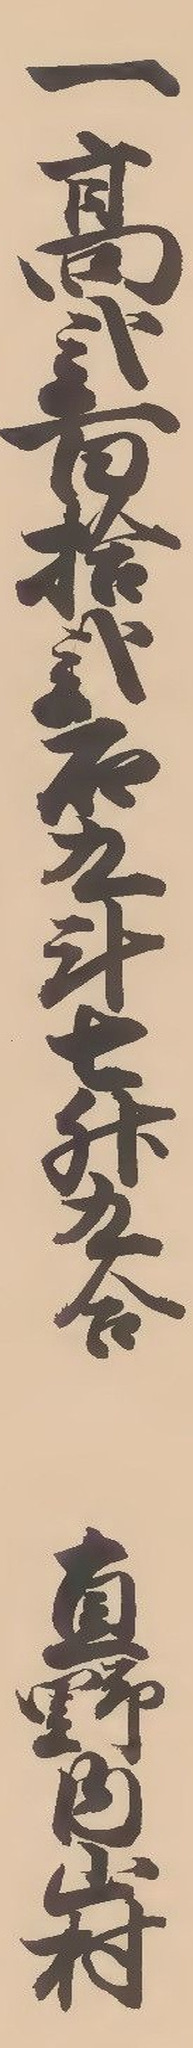一高弐百拾弐石九斗七升九合直野内山村
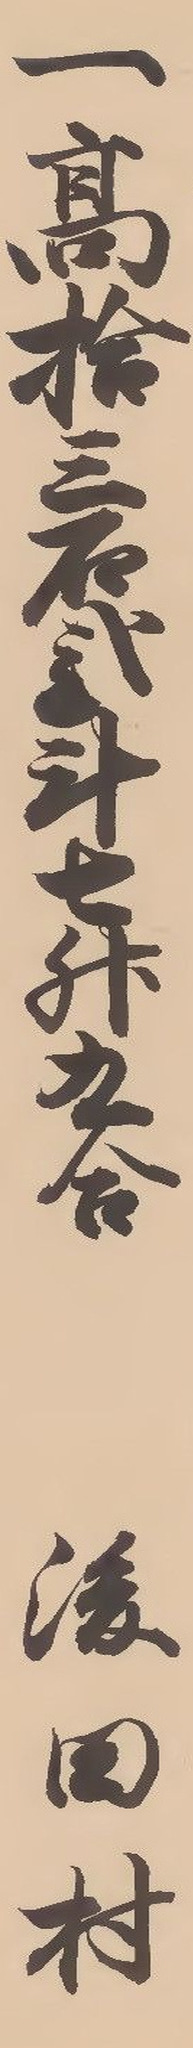一高拾三石弐斗七升九合後田村
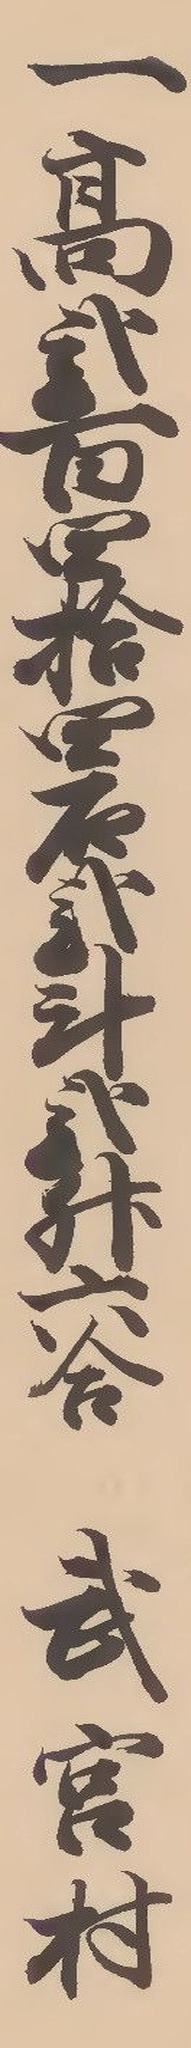一高弐百四拾四石弐斗弐升六合武宮村

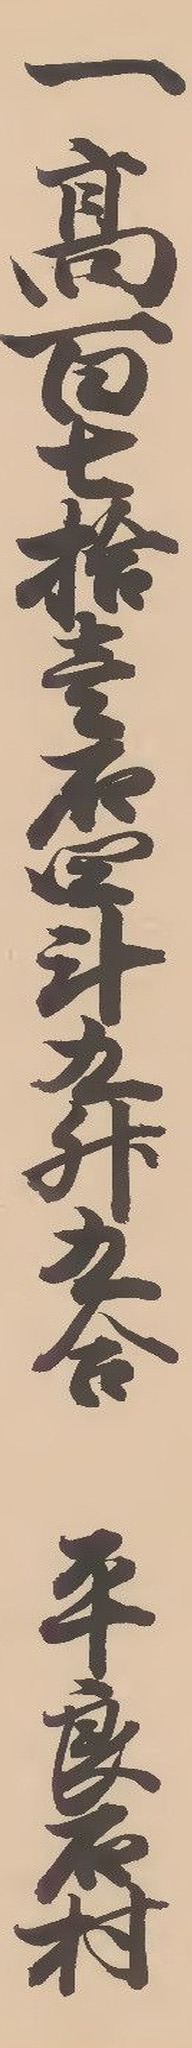一高百七拾壱石四斗九升九合平良石村
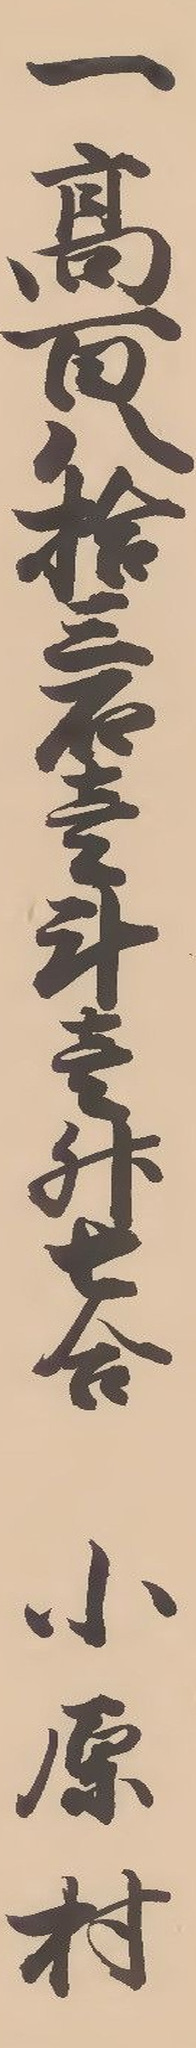一高百八拾三石壱斗壱升七合小原村
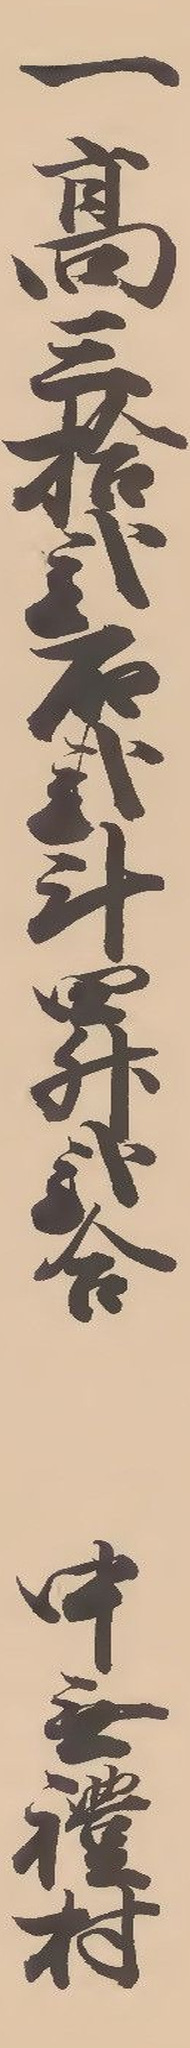一高三拾弐石弐斗四升弐合中無礼村
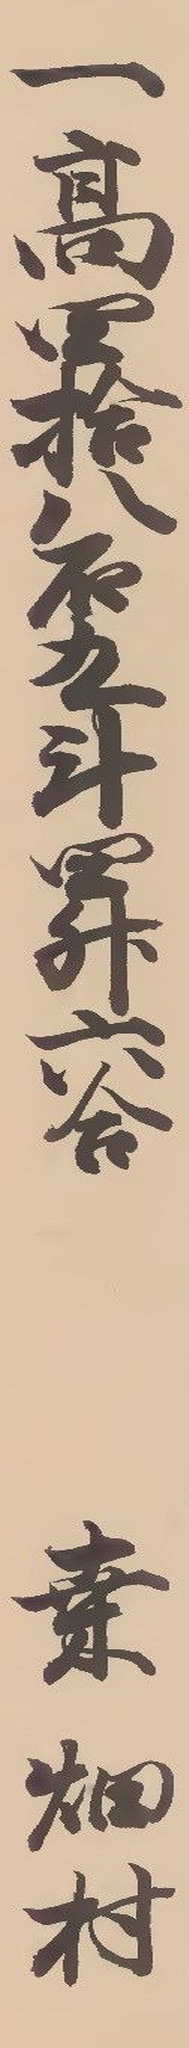一高四拾八石九斗四升六合桑畑村
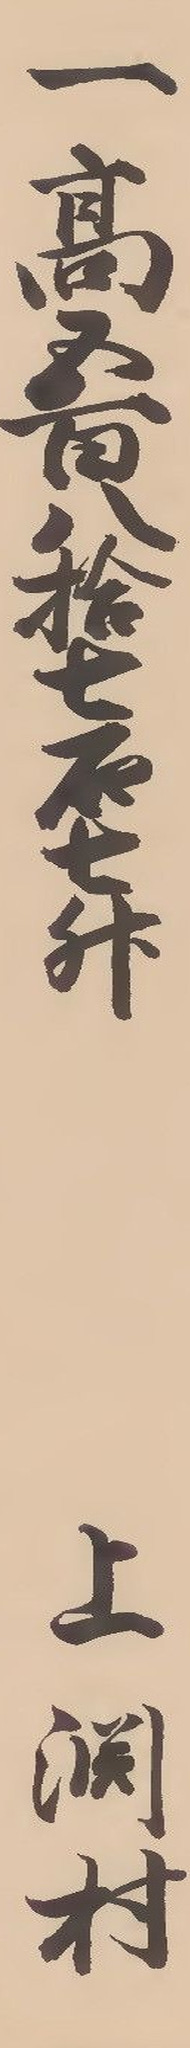一高五百八拾七石七升上渕村
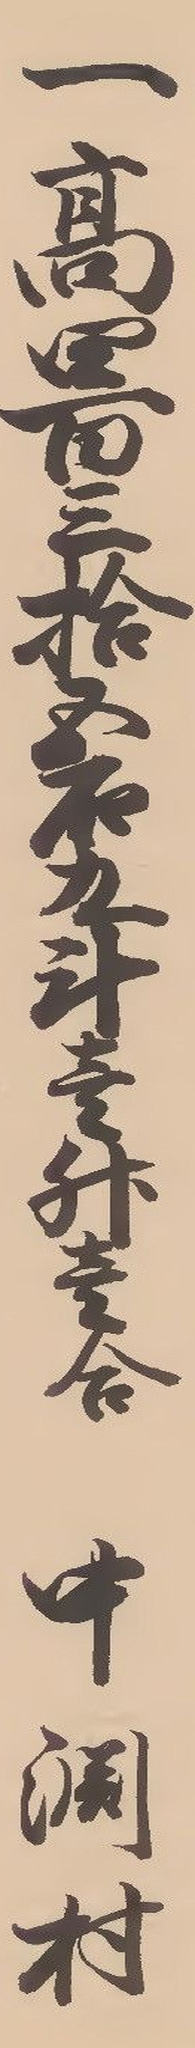一高四百三拾五石九斗壱升壱合中淵村
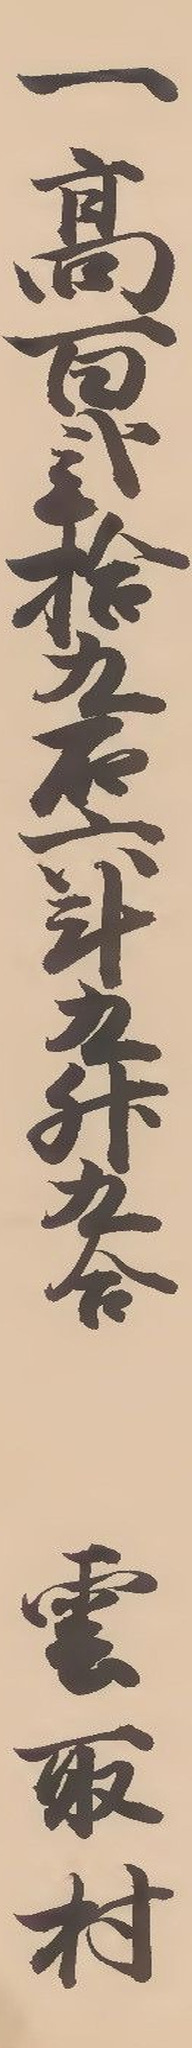一高百弐拾九石六斗九升九合雲取村

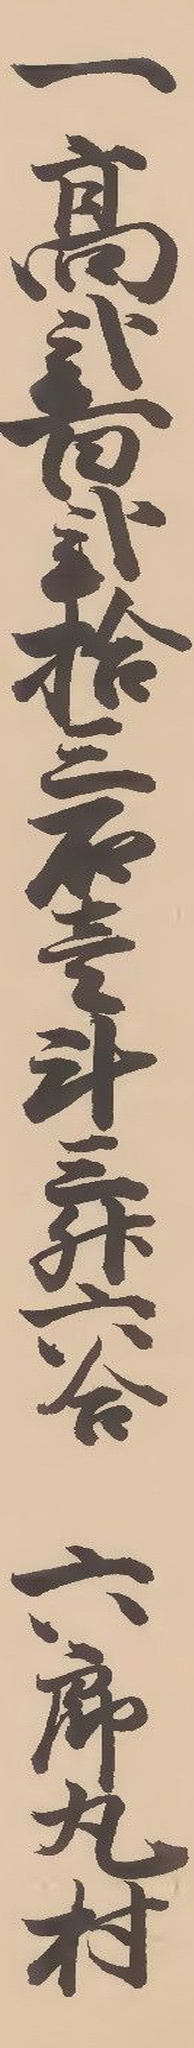一高弐百弐拾三石壱斗三升六合六郎丸村
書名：豊後国郷帳
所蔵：国立公文書館 National Archives of Japan
